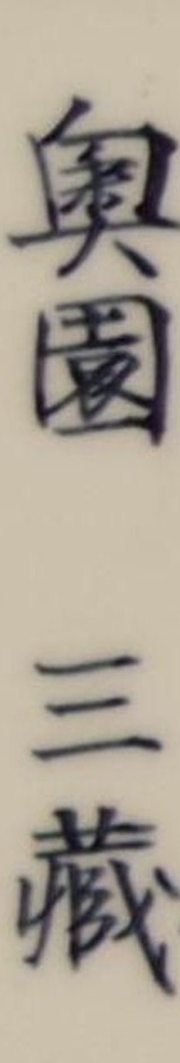奥園三蔵
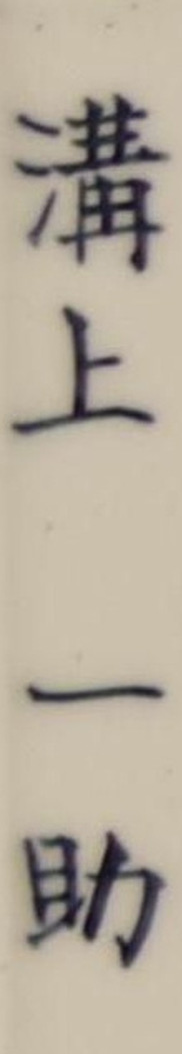溝上一助

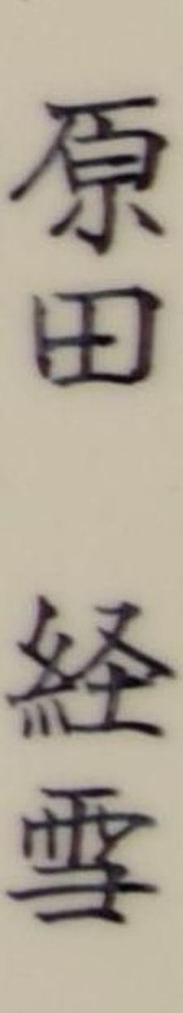原田経雪
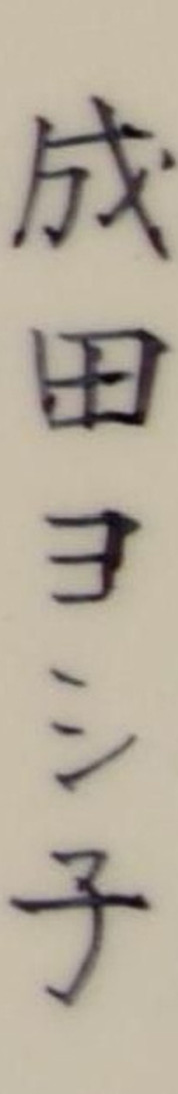成田ヨシ子
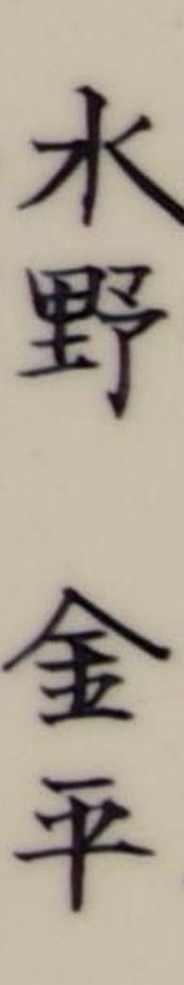水野金平
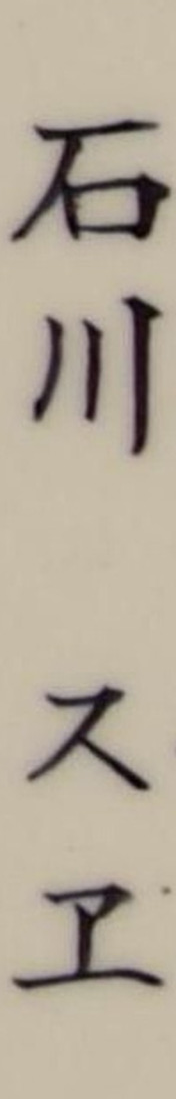石川スエ
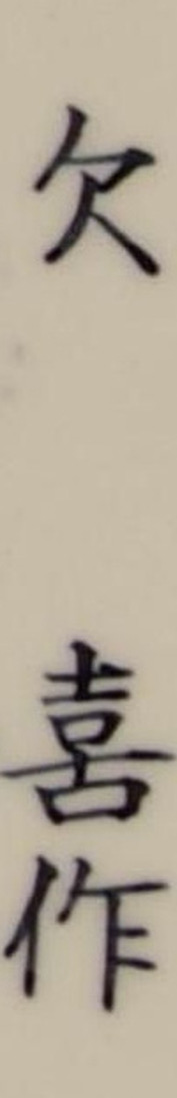欠喜作
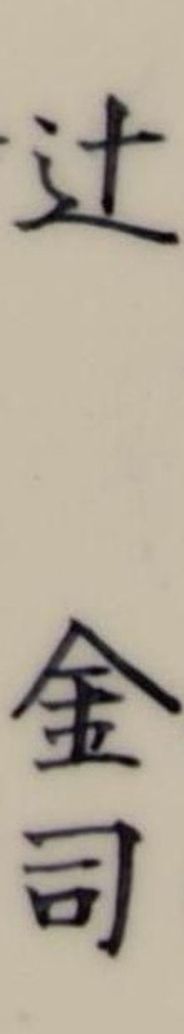辻金司
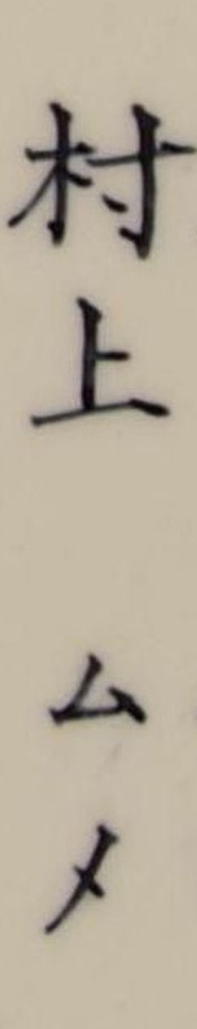村上ムメ
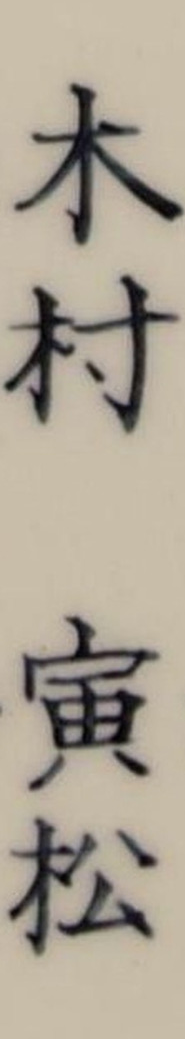木村寅松
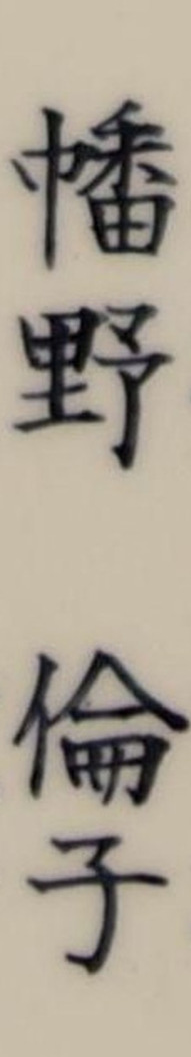幡野倫子
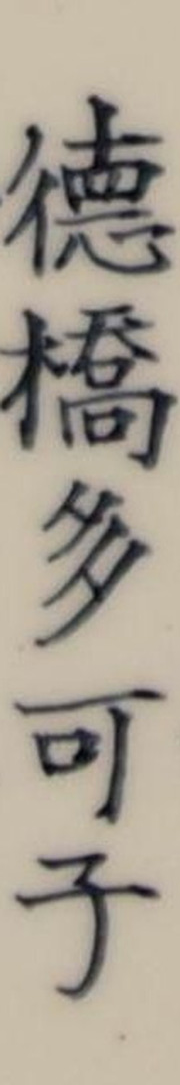徳橋多可子
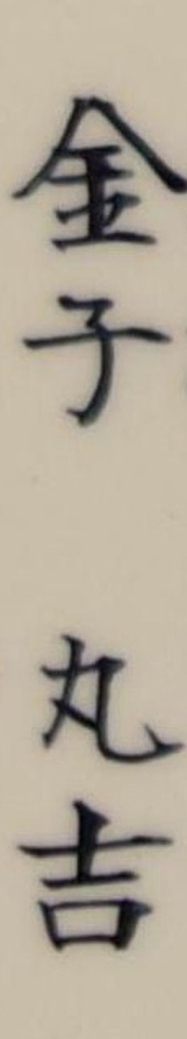金子丸吉
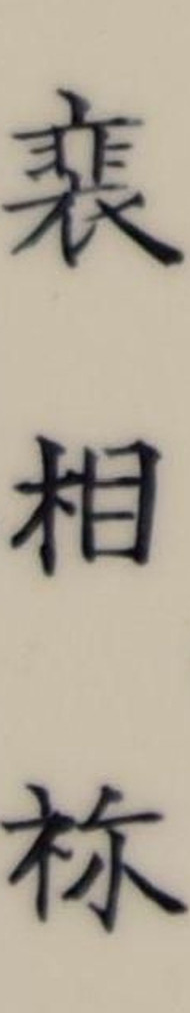襄相祢
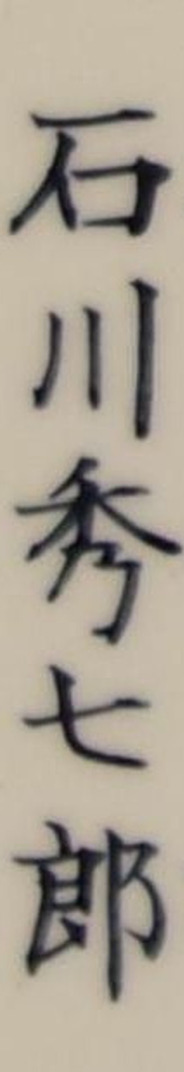石川秀七郎
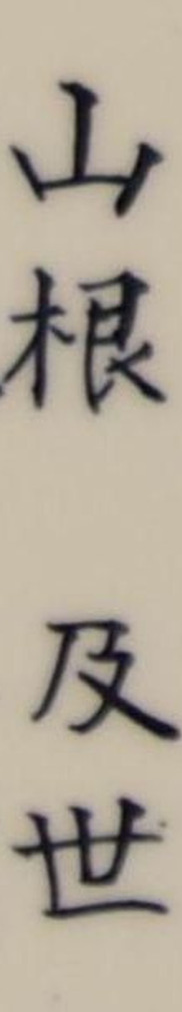山根及世
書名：M~S
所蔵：高野山金剛峯寺
